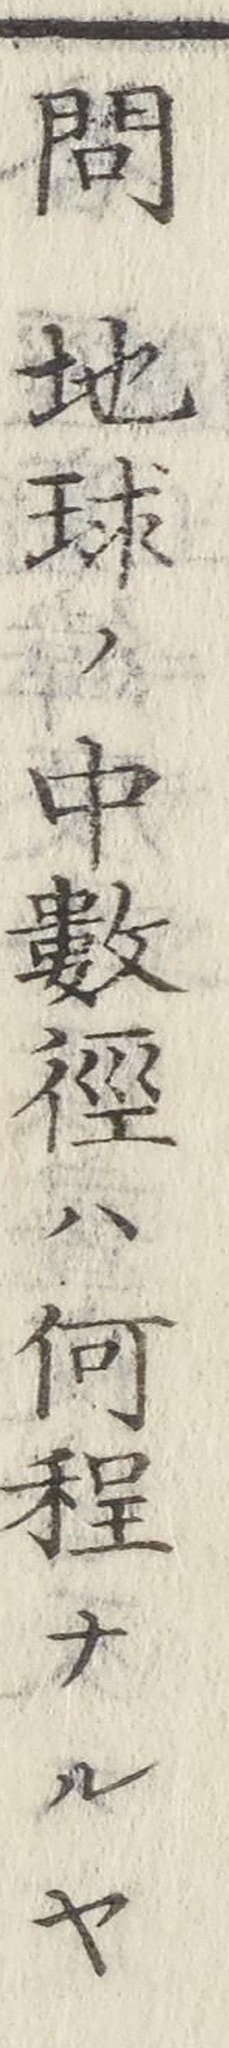問地球ノ中数径ハ何程ナルヤ
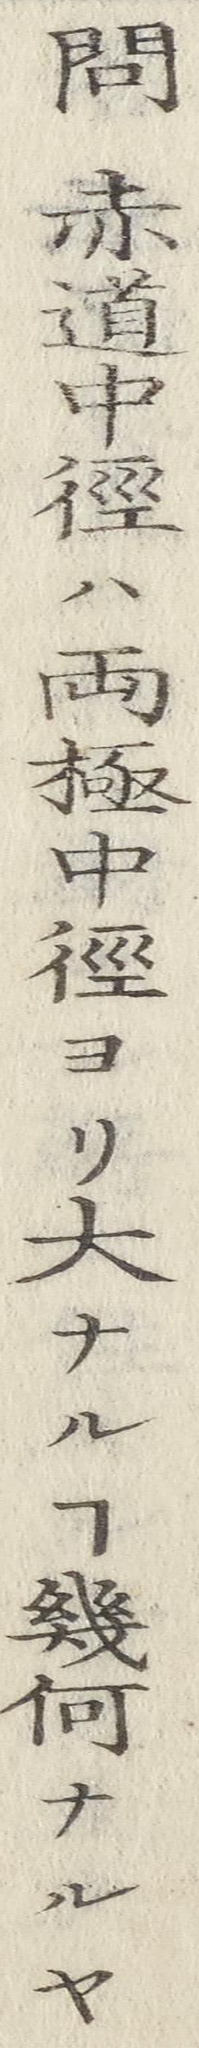問赤道中径ハ両極中径ヨリ大ナルコト幾何ナルヤ
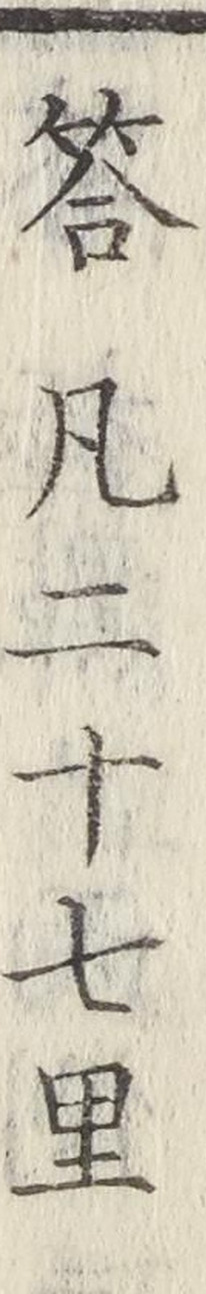答凡二十七里
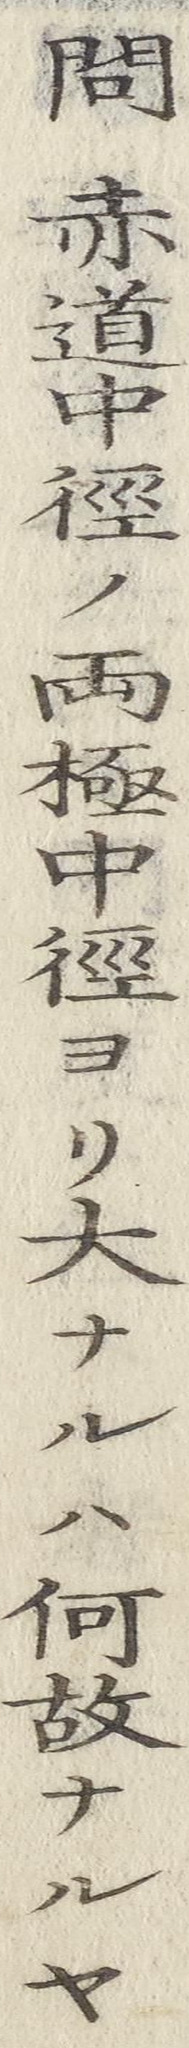問赤道中径ノ両極中径ヨリ大ナルハ何故ナルヤ
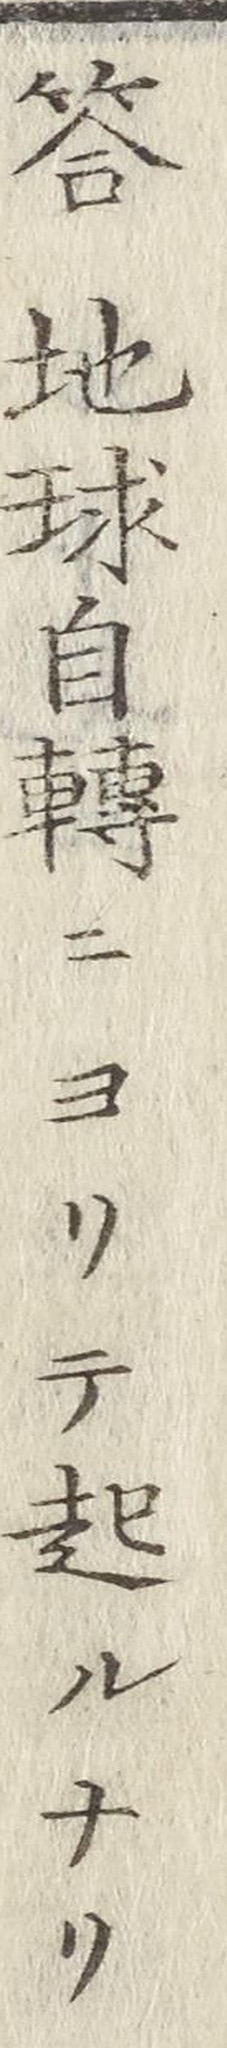答地球自転ニヨリテ起ルナリ
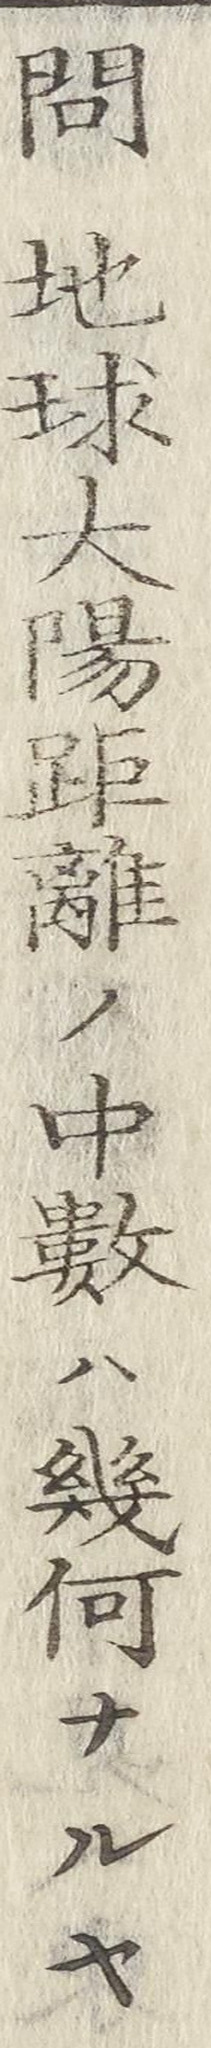問地球大陽距離ノ中数ハ幾何ナルヤ
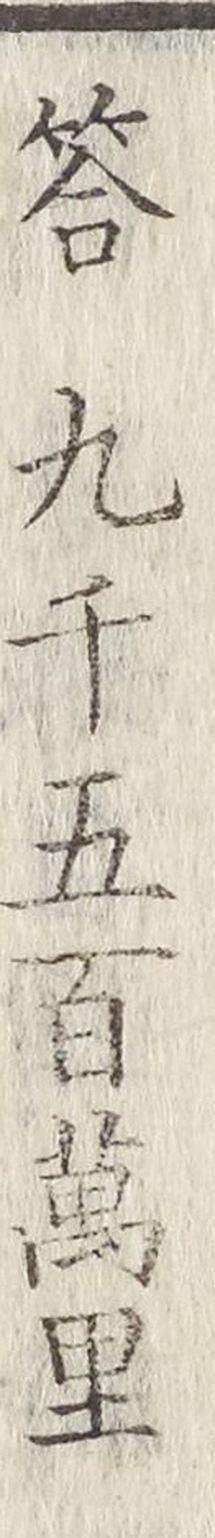答九千五百万里
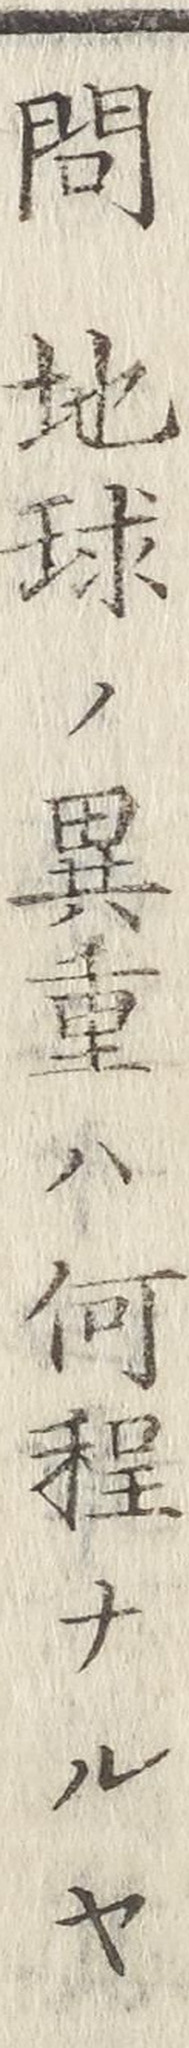問地球ノ異重ハ何程ナルヤ
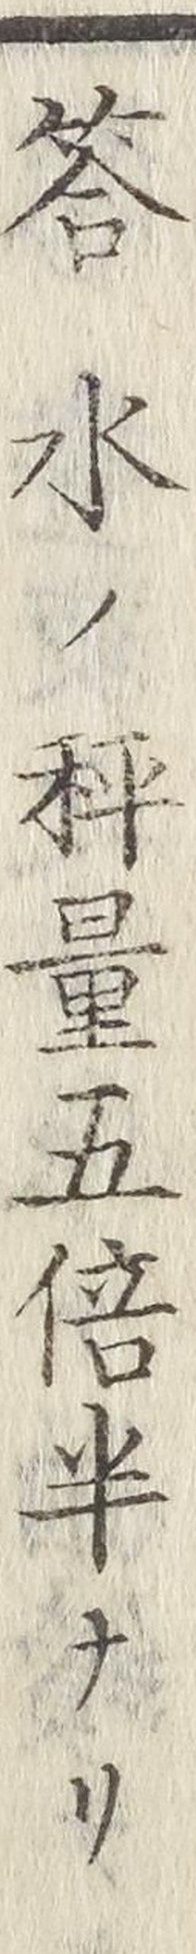答水ノ秤量五倍半ナリ
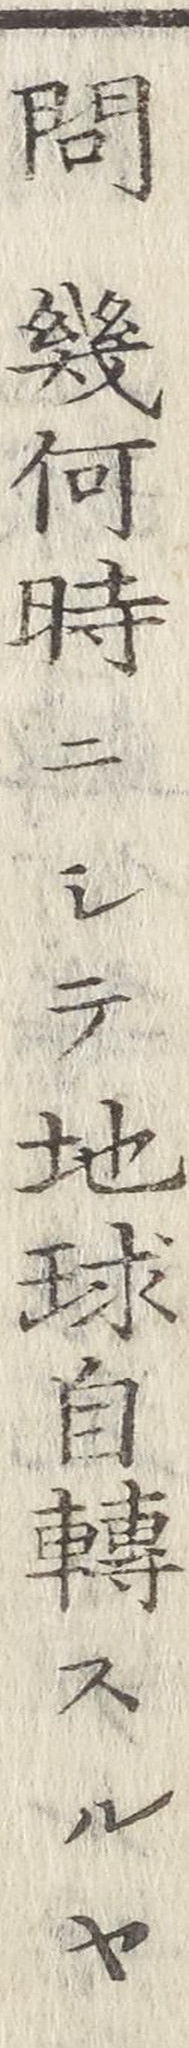問幾何時ニシテ地球自転スルヤ
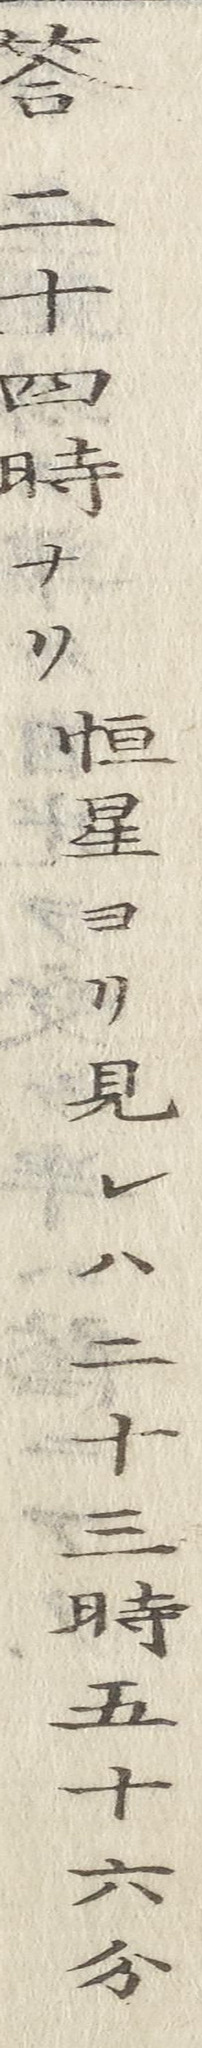答二十四時ナリ恒星ヨリ見レハ二十三時五十六分
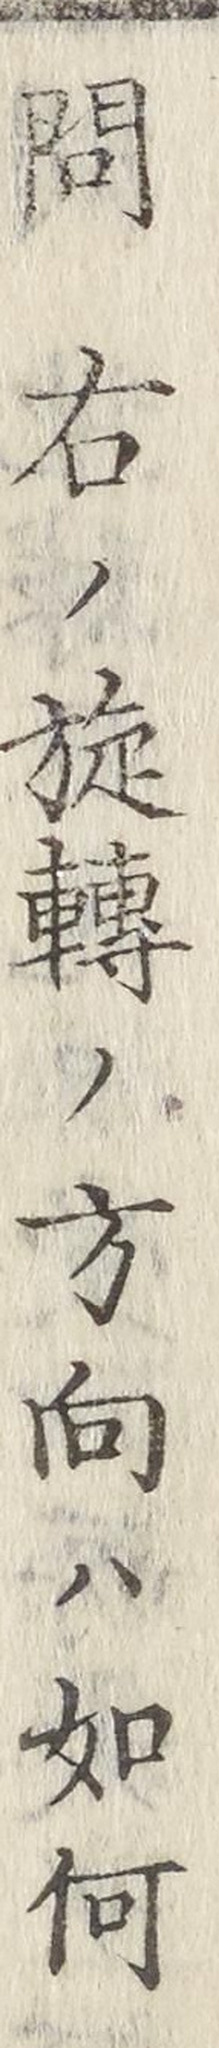問右ノ旋転ノ方向ハ如何
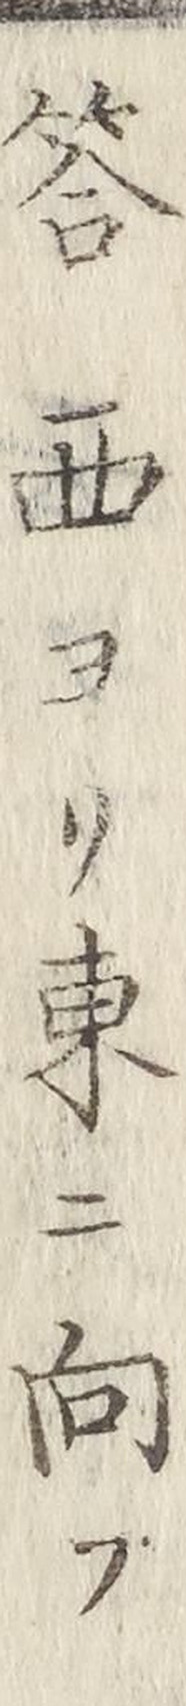答西ヨリ東ニ向フ
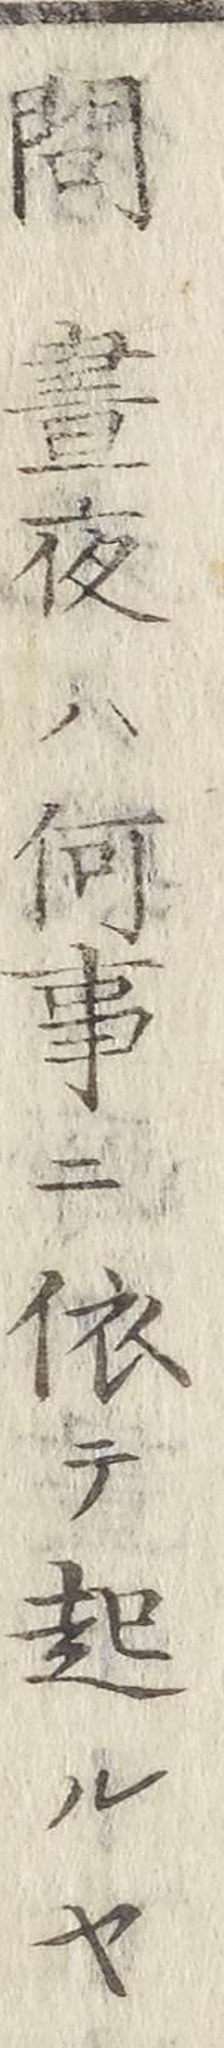問昼夜ハ何事ニ依テ起ルヤ

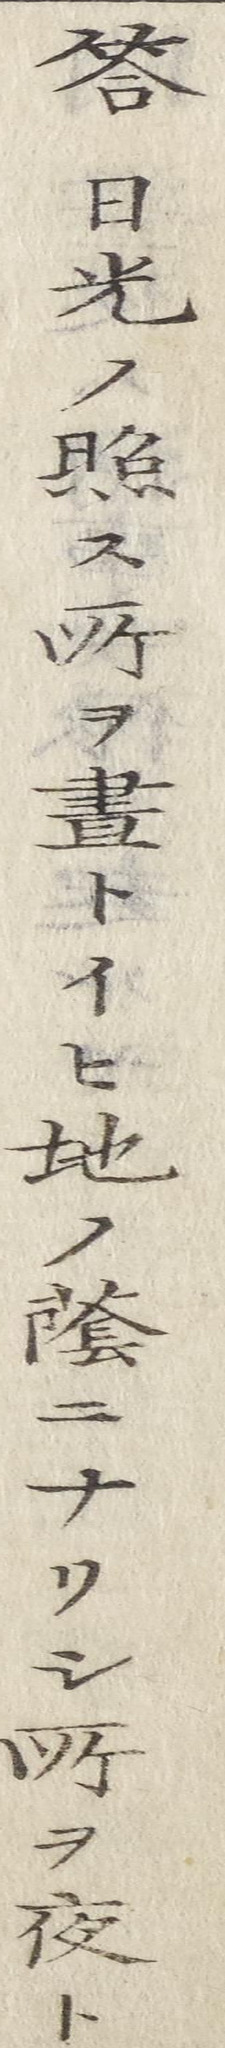答日光ノ照ス所ヲ昼トイヒ地ノ蔭ニナリシ所ヲ夜ト
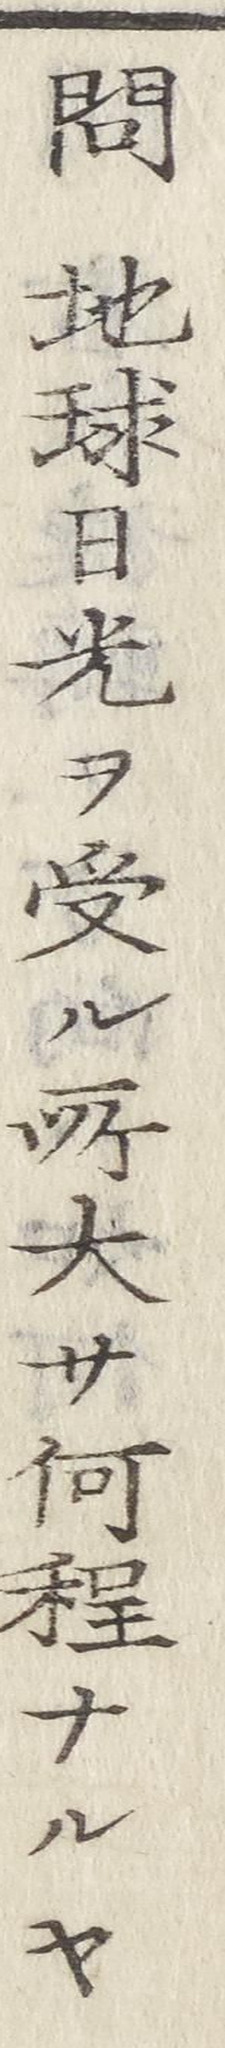問地球日光ヲ受ル所大サ何程ナルヤ
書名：星学圖説　上
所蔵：東京大学地震研究所図書室 Earthquake Research Institute Library, The University of Tokyo, JAPAN
